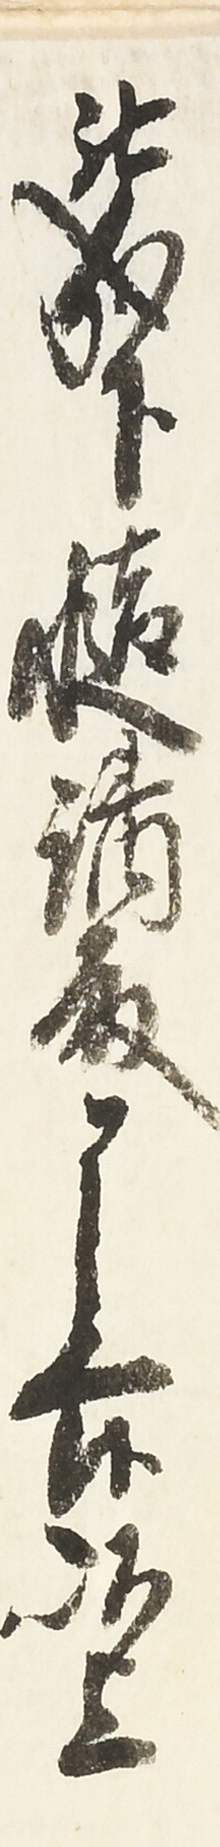被成下慥請取申上候以上
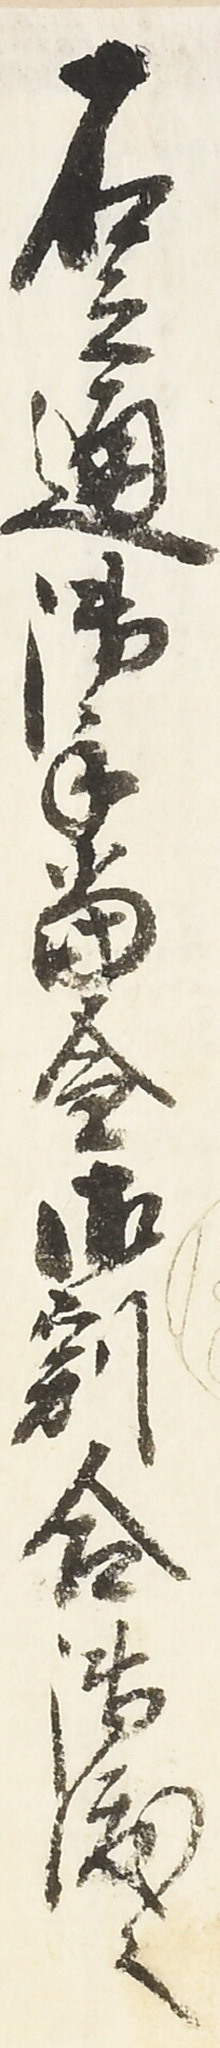右之通御手当金御割合御渡し
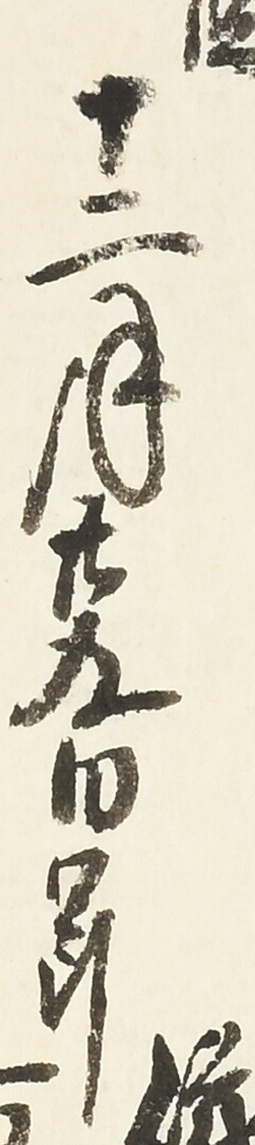十二月廿九日同断
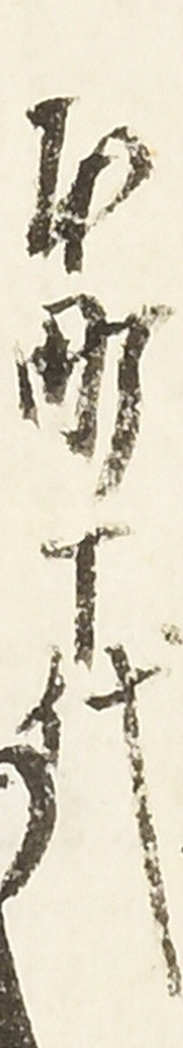本町丁代
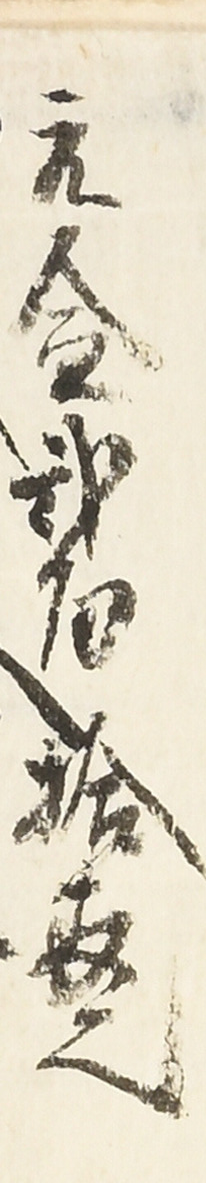元金弐百拾両也
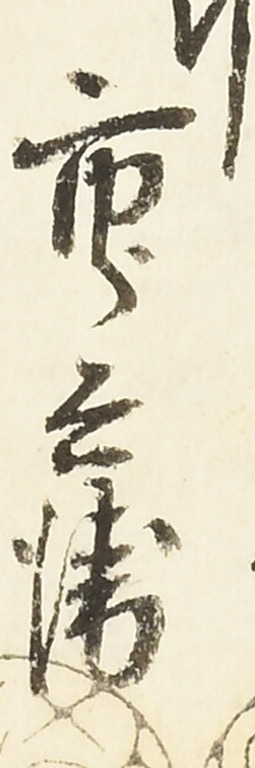市郎兵衛
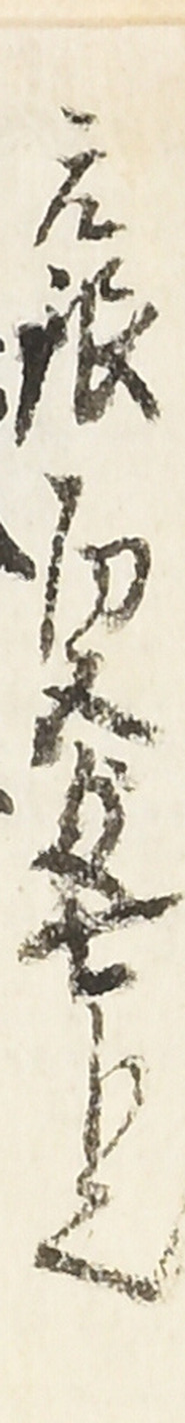元銀百五匁七分也
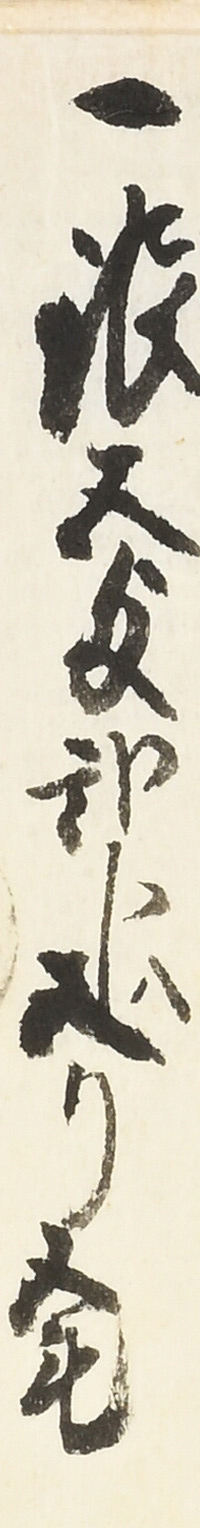一銀五匁弐分八厘五毛
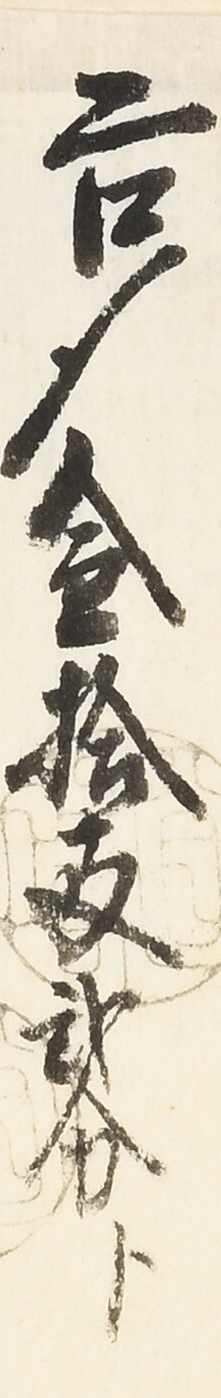二口〆金拾両弐分ト
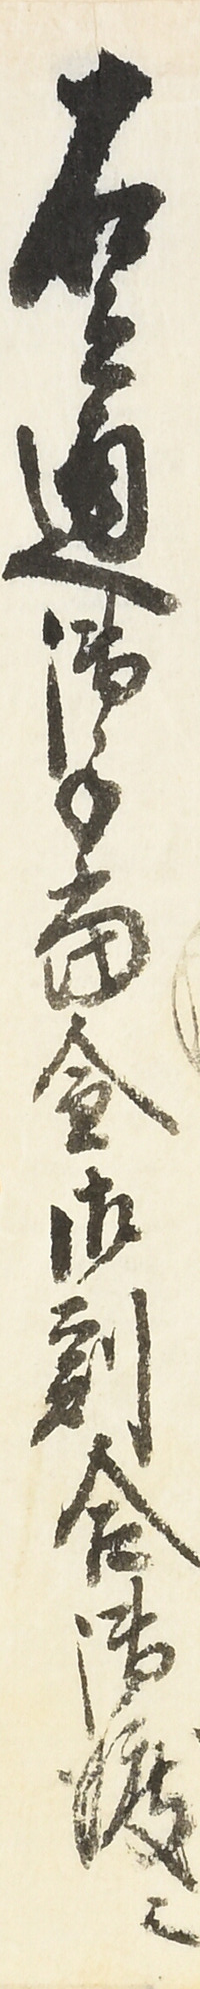右之通御手当金御割合御渡し
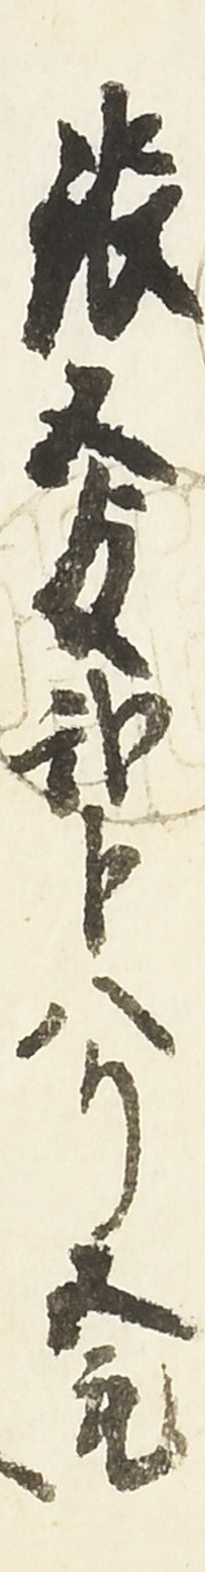銀五匁弐分八厘五毛
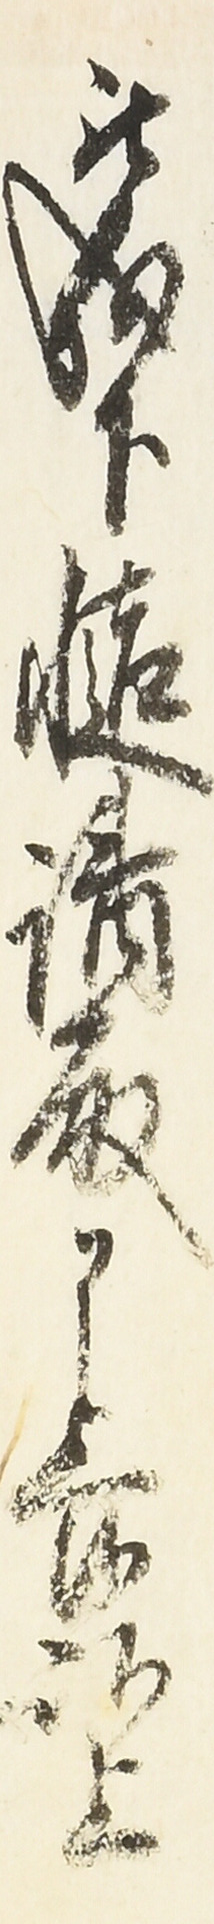被成下慥請取申上候以上
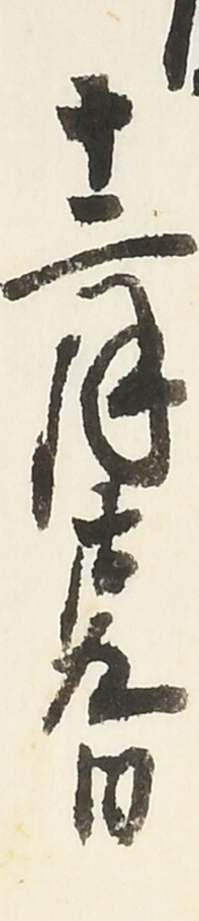十二月廿九日同断
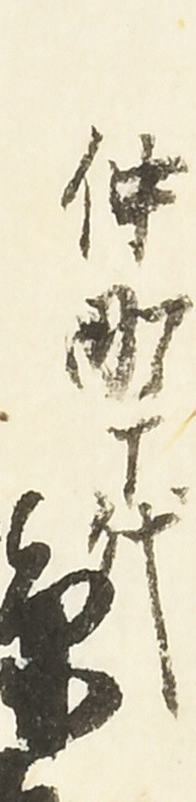仲町丁代
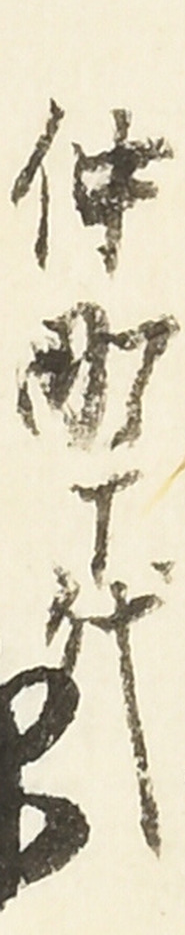仲町丁代
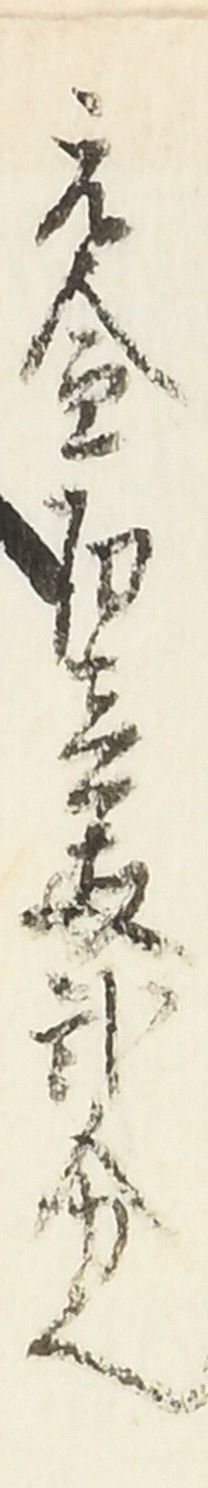元金百壱両弐分也
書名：御才覚金御利足割渡扣帳
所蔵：伊那市立高遠町図書館・合同会社AMANE
